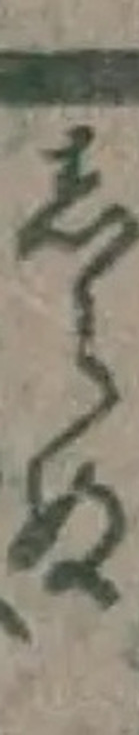しらぬ
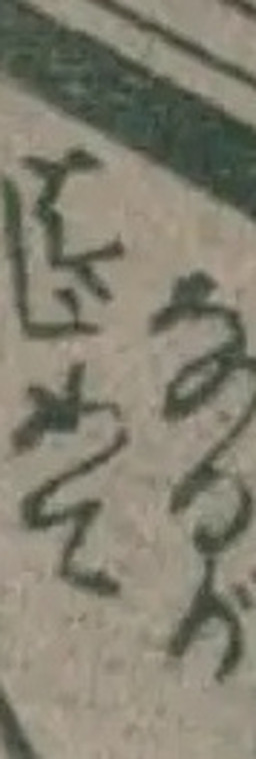はじめて
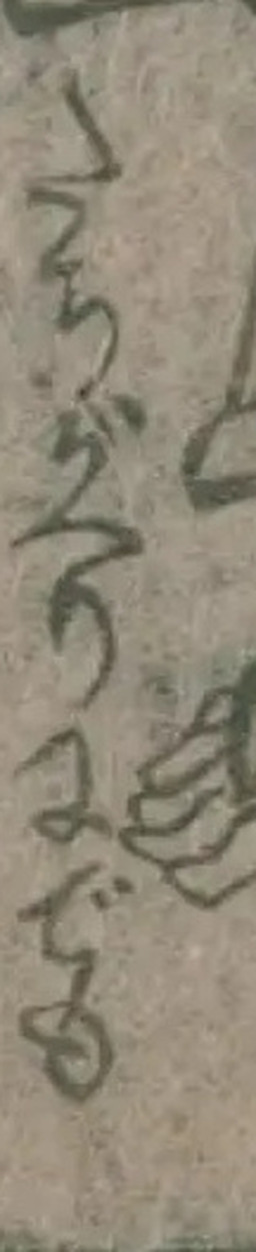たちがへりにでも
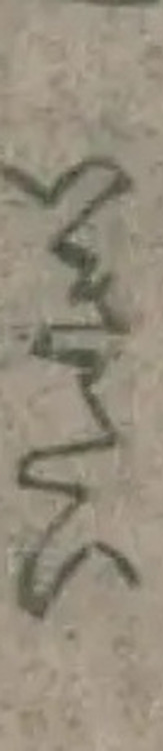いきたい
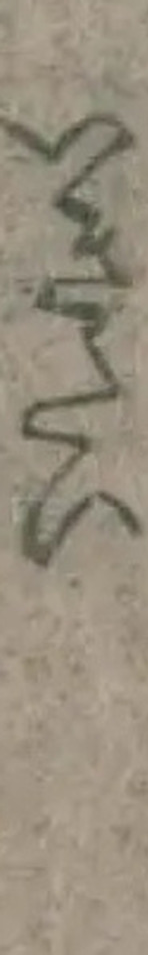いきたい
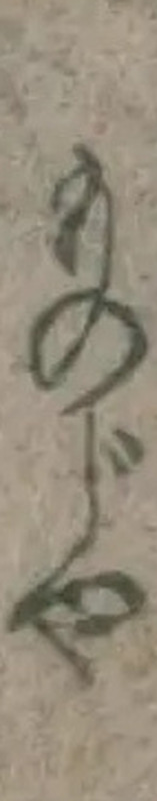ものじや
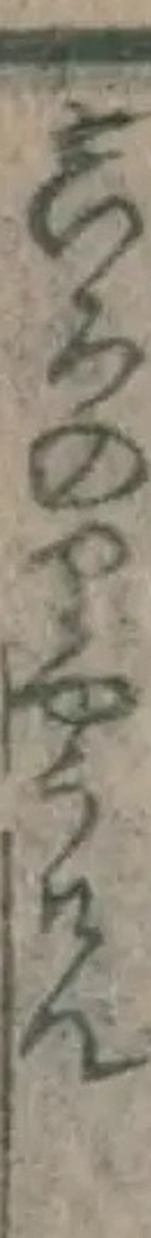といろのりやうけん

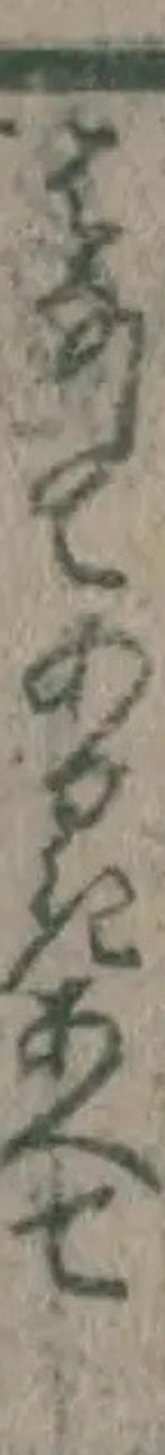はなしてあるきあへて
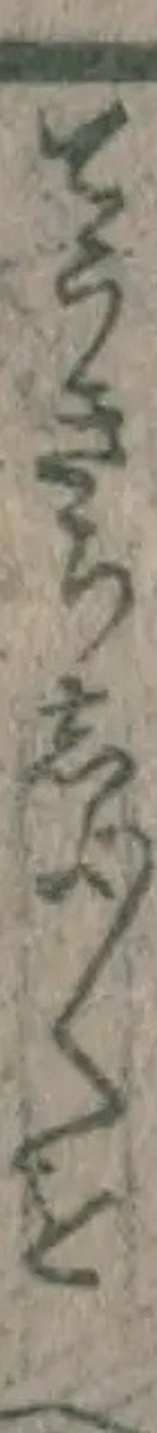てうきちしよ〳〵を
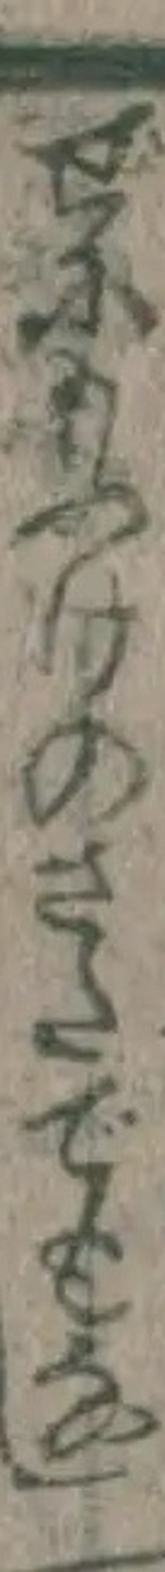ぜにもうけのさたでもなし
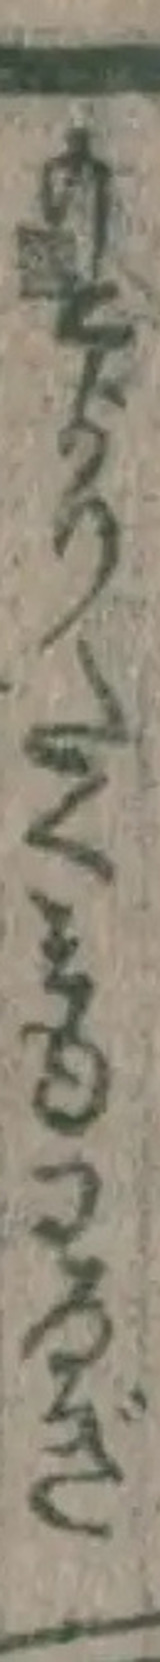もとよりたくみもわるぎ
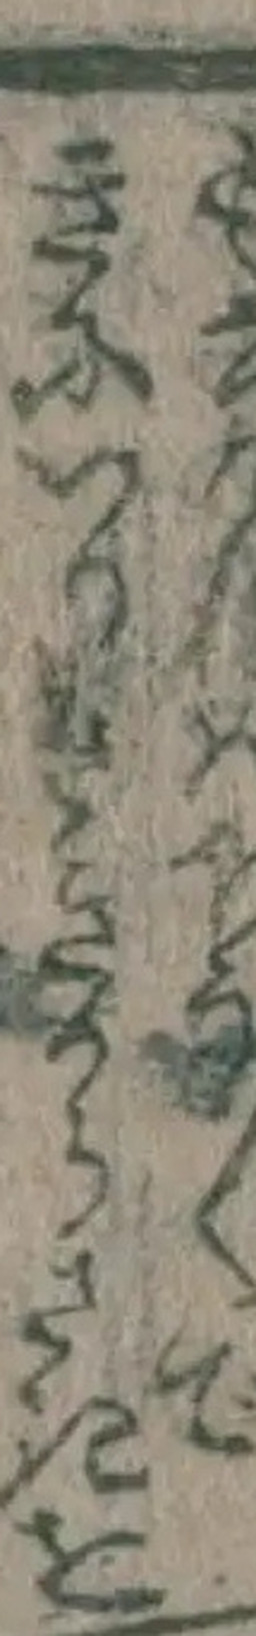きにいりさきからさきと
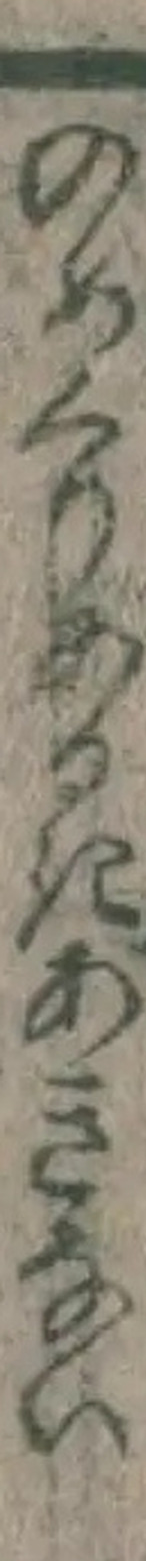のめくりあるきあきない
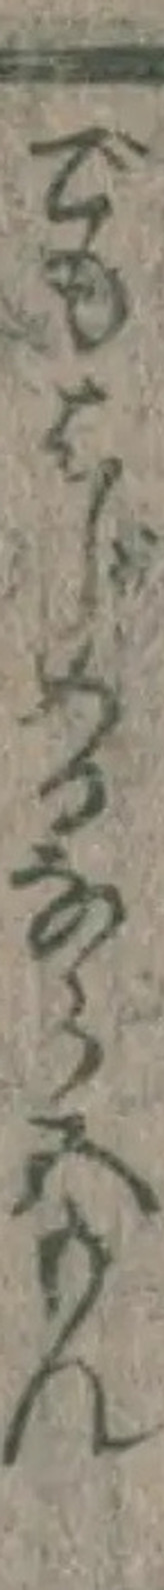でもはじめるなら五もん
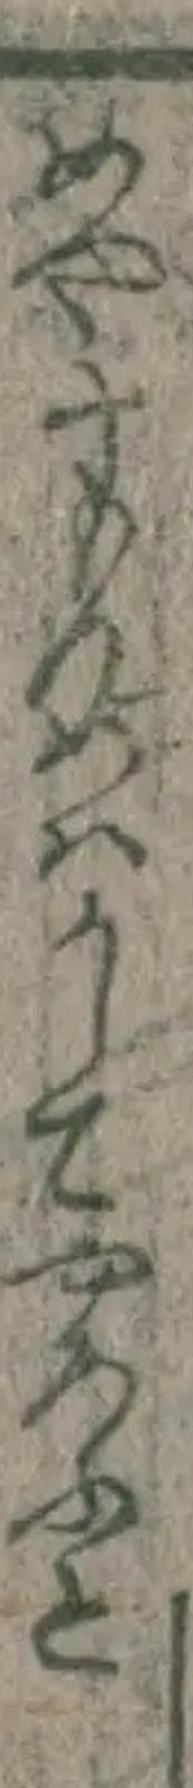めやすもんめはうしてやろうふと
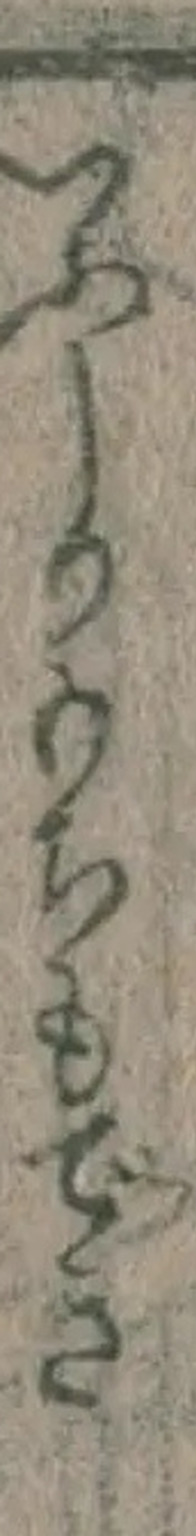いふしうもちもでき
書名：縦筒放唐の噺 3巻
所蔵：国立国会図書館 National Diet Library, JAPAN
